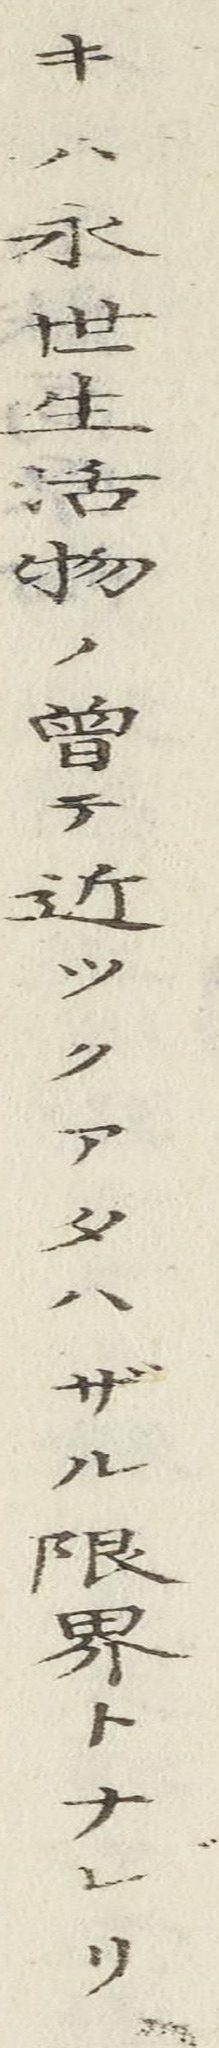キハ永世生活物ノ曾テ近ツクアタハザル限界トナレリ、
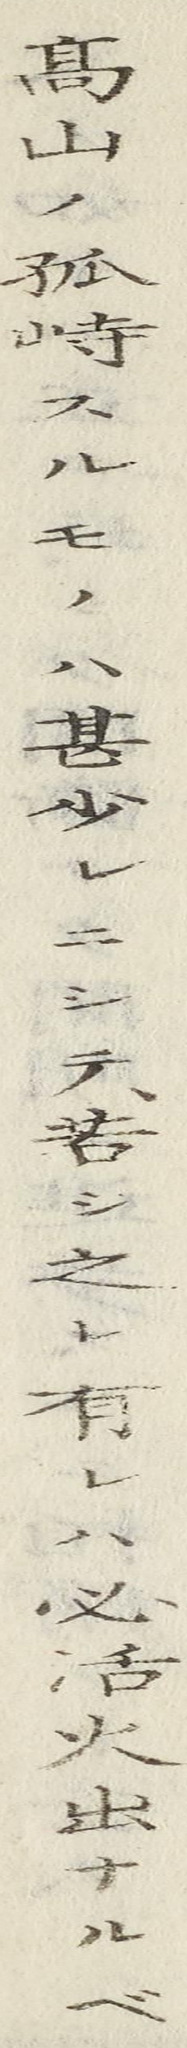高山ノ孤峙スルモノハ甚少レニシテ、若シ之レ有レハ必活火出ナルベ
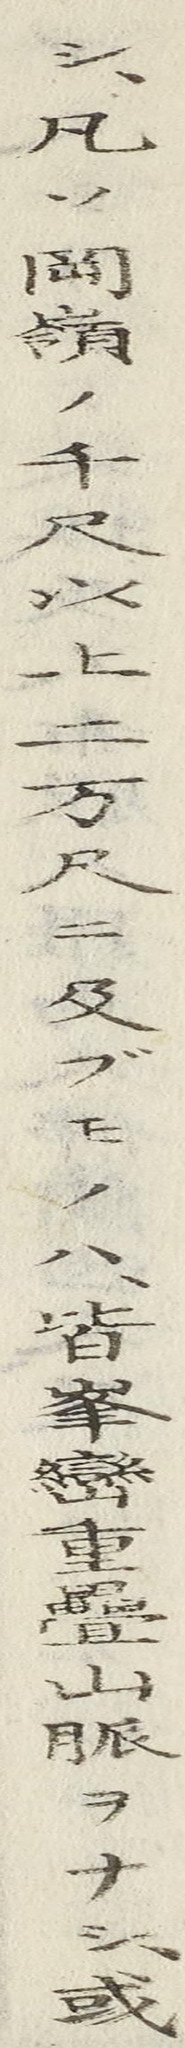シ、凡ソ岡嶺ノ千尺以上二万尺ニ及ブモノハ、皆峯巒重畳山脈ヲナシ、或
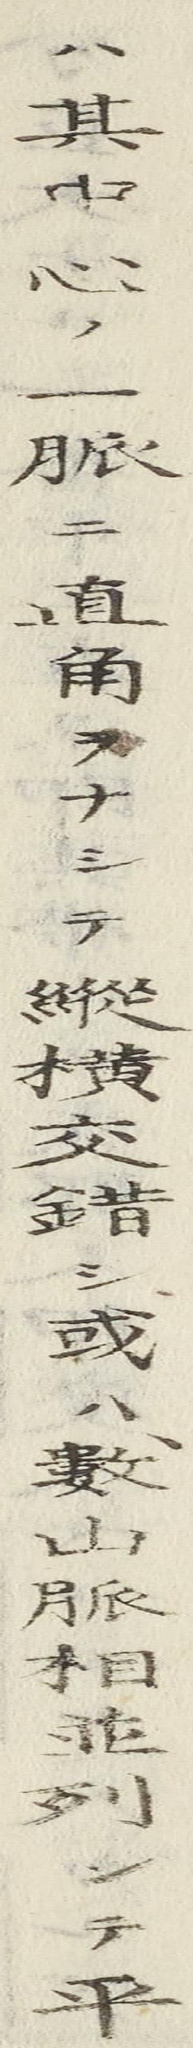ハ其中心ノ一脈ニ直角ヲナシテ縦横交錯シ、或ハ、数山脈相並列シテ平
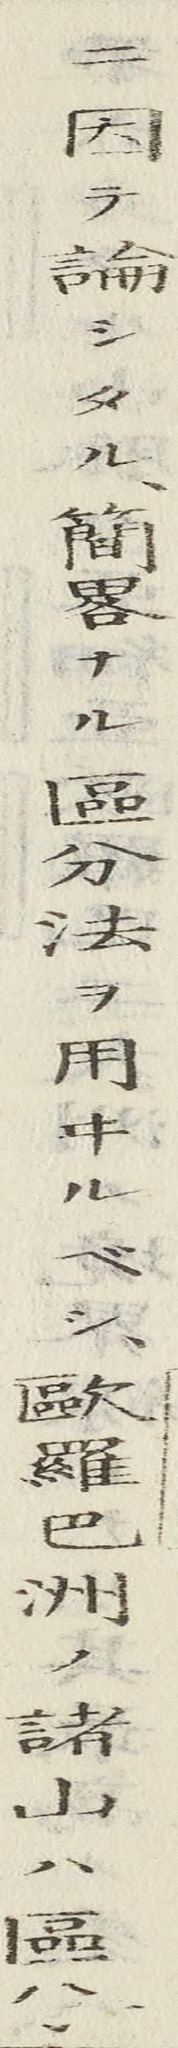ニ因テ論シタル、簡略ナル区分法ヲ用ヰルベシ、欧羅巴洲ノ諸山ハ区分
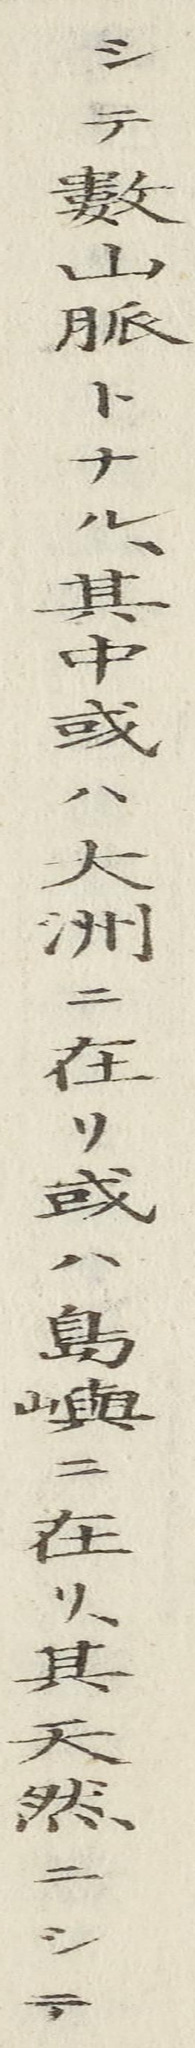シテ数山脈トナル、其中或ハ大洲ニ在リ或ハ島嶼ニ在リ、其天然ニシテ
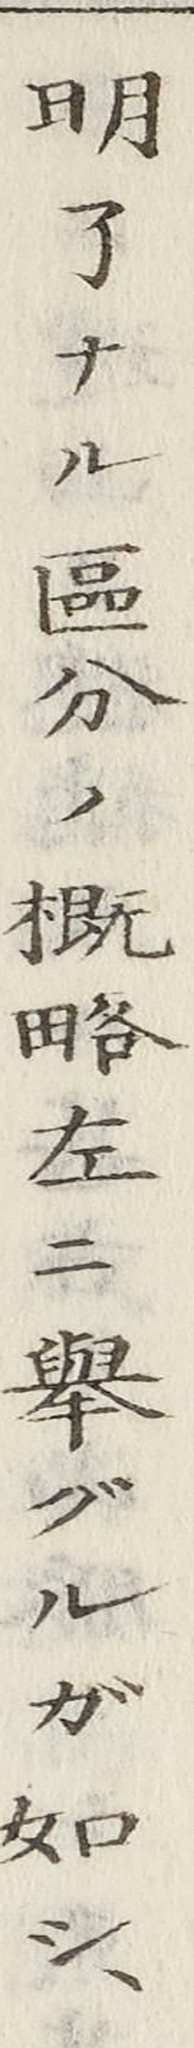明了ナル区分ノ概略左ニ挙グルガ如シ、
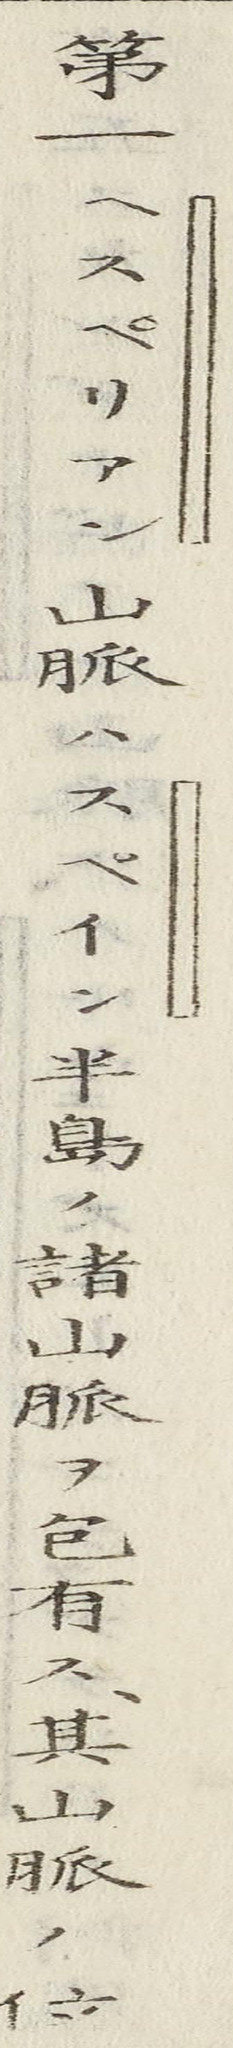第一ヘスペリアン山脈ハスペイン半島ノ諸山脈包有ス、其山脈ノ位
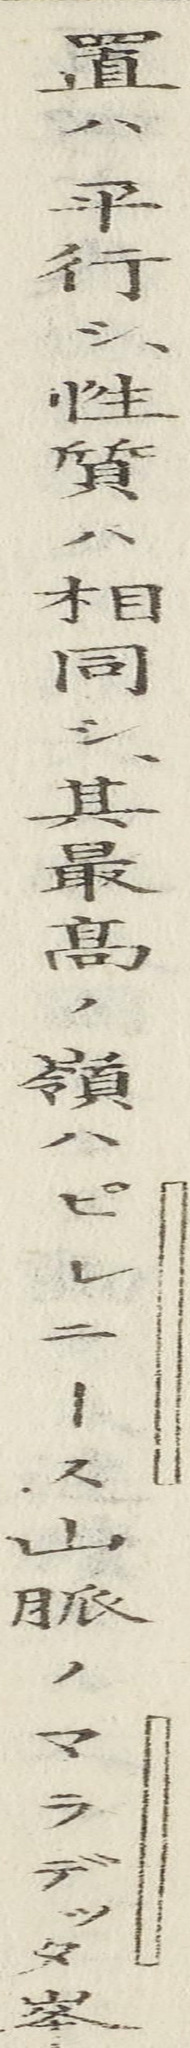置ハ平行シ、性質ハ相同シ、其最高ノ嶺ハピレニース山脈ノマラデッタ峯
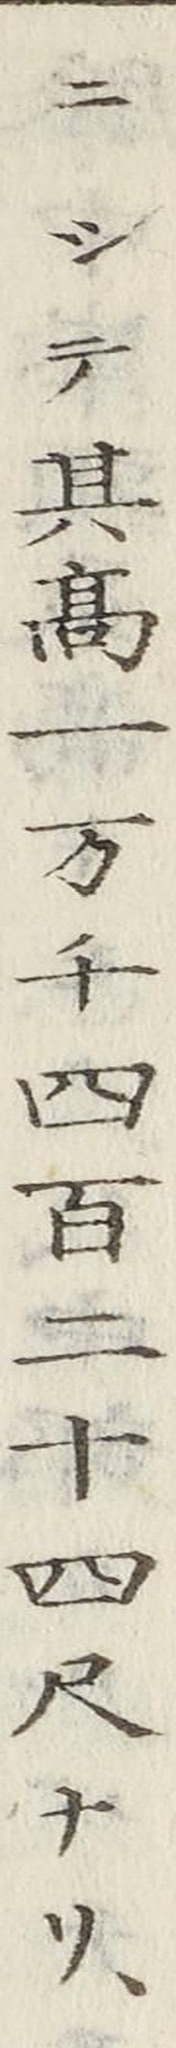ニシテ其高一万千四百二十四尺アリ、
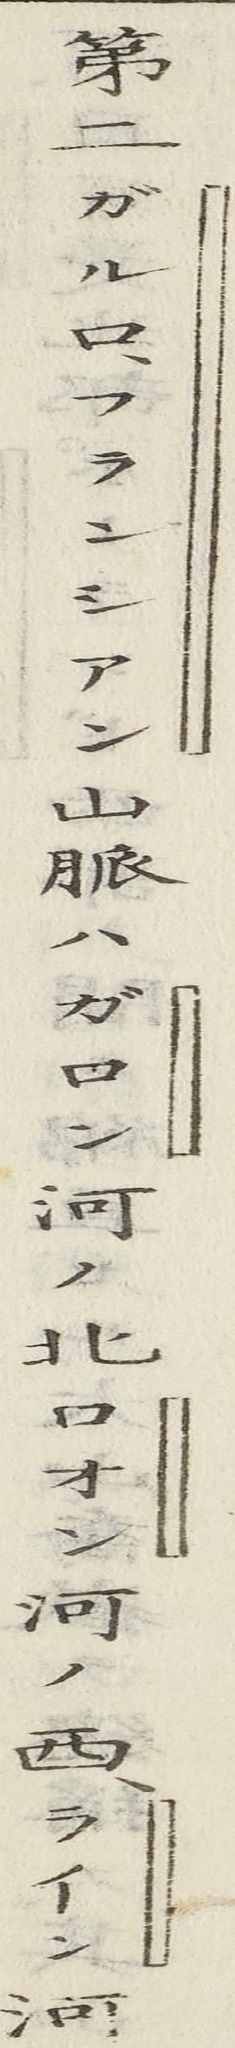第二ガルロ、フランシアン山脈ハガロン河ノ北ロオン河ノ西、ライン河
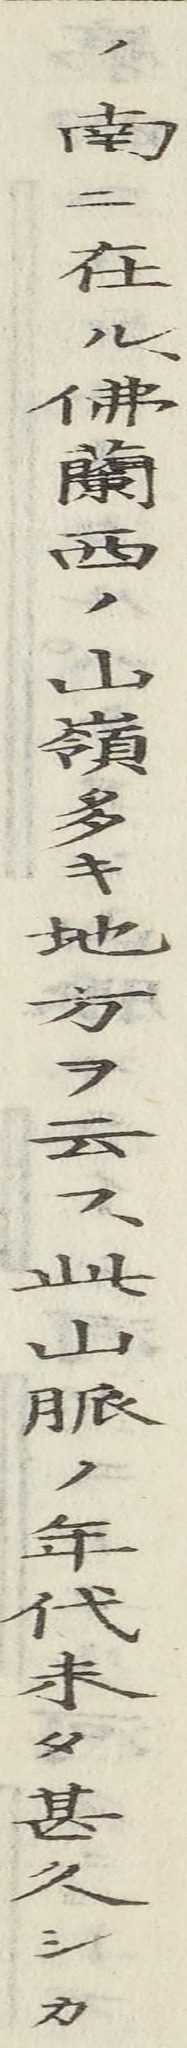ノ南ニ在ル、仏蘭西ノ山嶺多キ地方ヲ云フ、此山脈ノ年代未タ甚久シカ
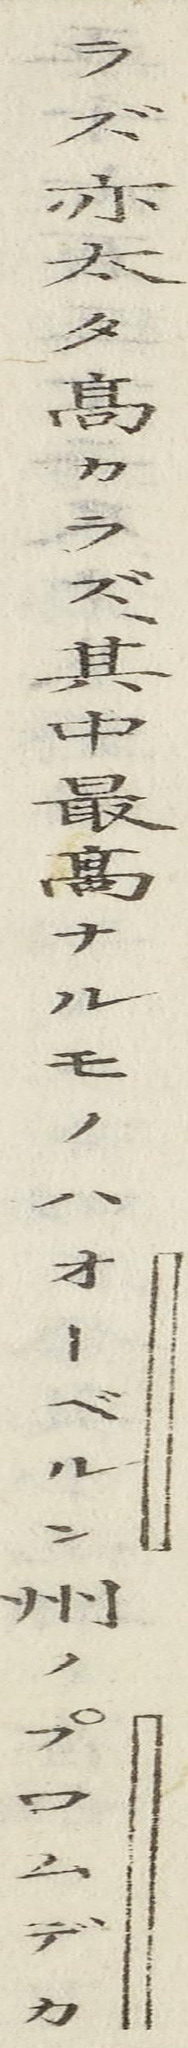ラズ亦太タ高カラズ、其中最高ナルモノハオーベルン州ノプロムデカ
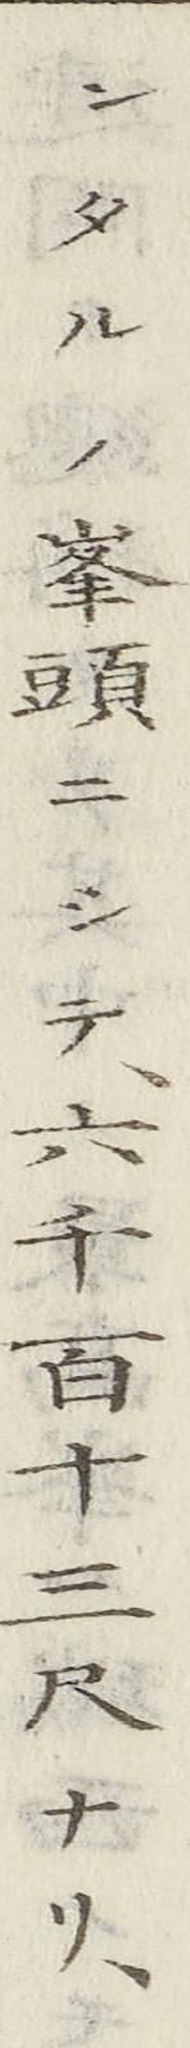ンタルノ峯頭ニシテ、六千百十三尺ナリ、
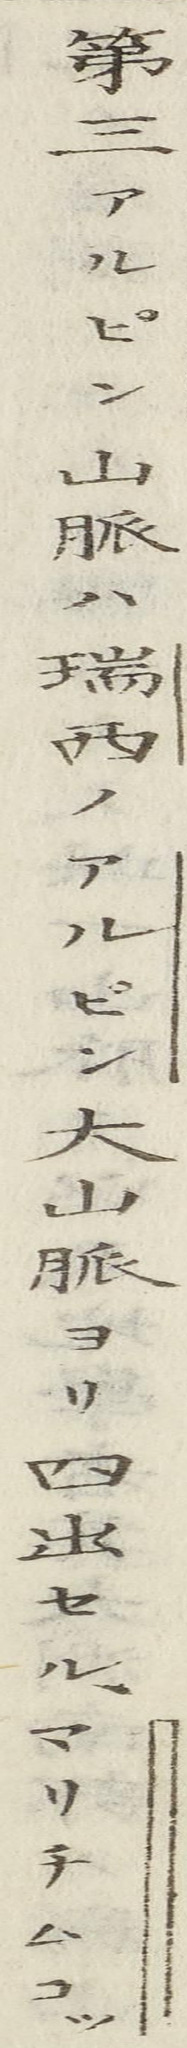第三アルピン山脈ハ瑞西ノアルピン大山脈ヨリ四出セル、マリチムコッ
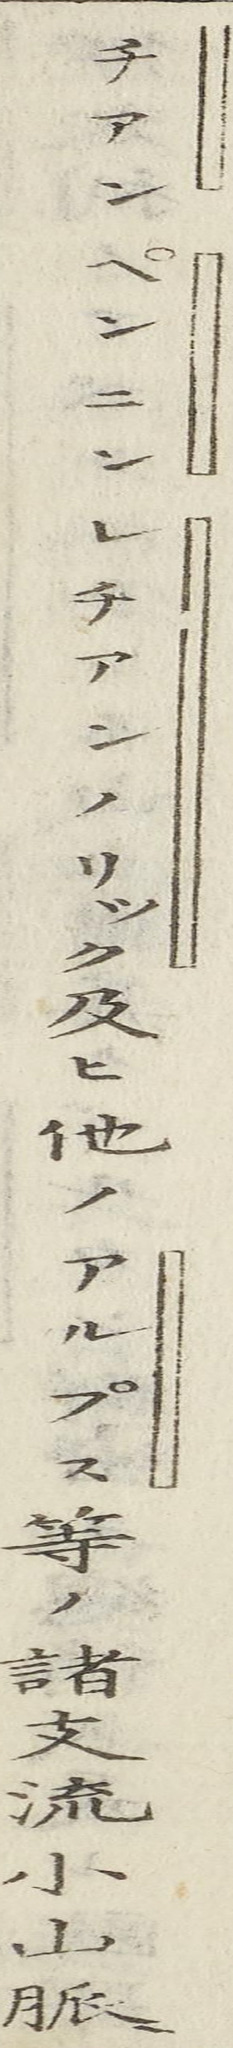チアンペンニンレチアンノリック及ヒ他ノアルプス等ノ諸支流小山脈
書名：百科全書　地文學　全
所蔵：東京大学地震研究所図書室 Earthquake Research Institute Library, The University of Tokyo, JAPAN
